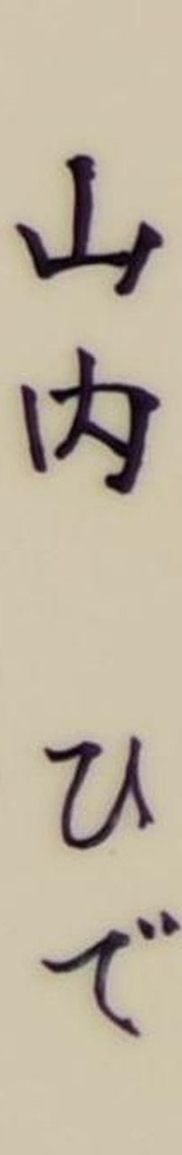山内ひで
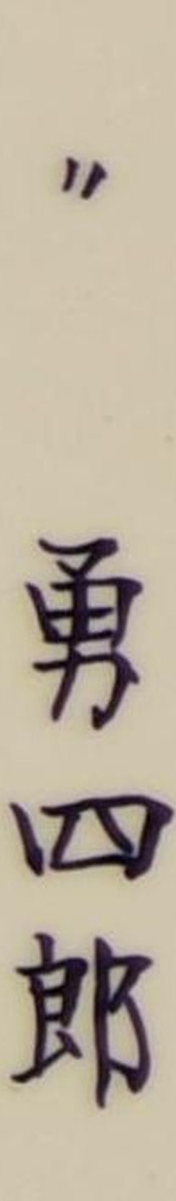勇四郎
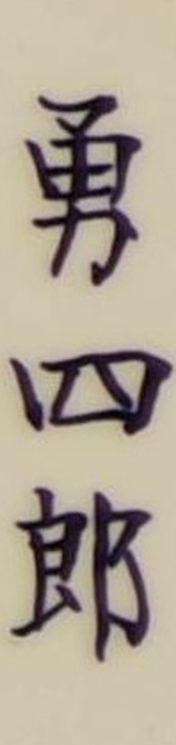勇四郎
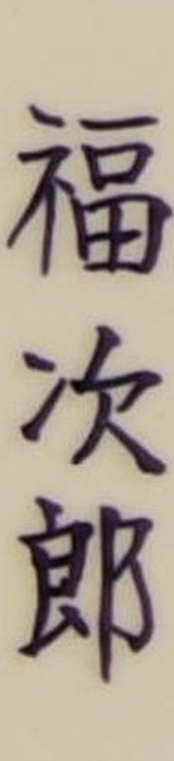福次郎

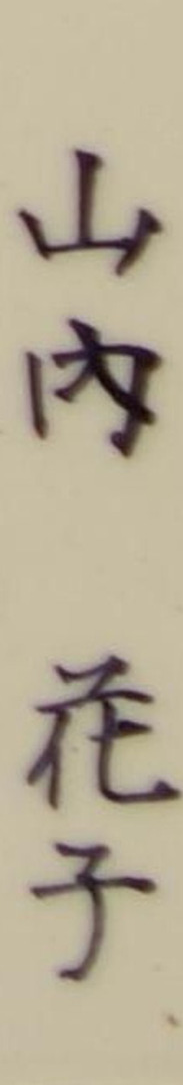山内花子
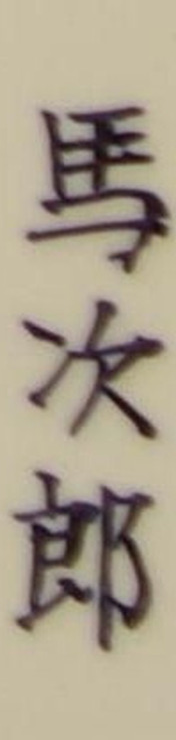馬次郎
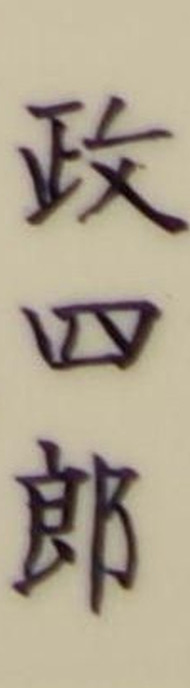政四郎
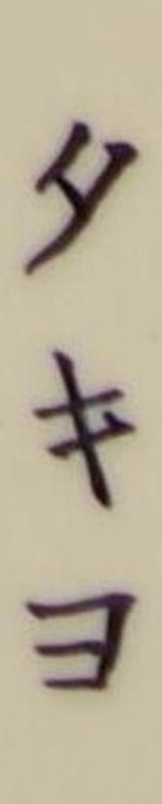タキヨ
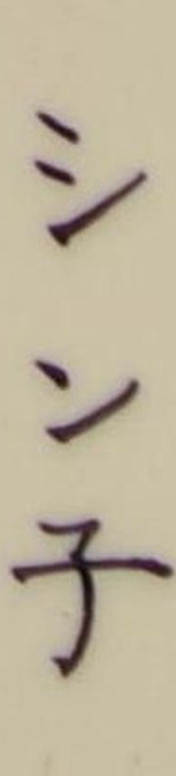シン子
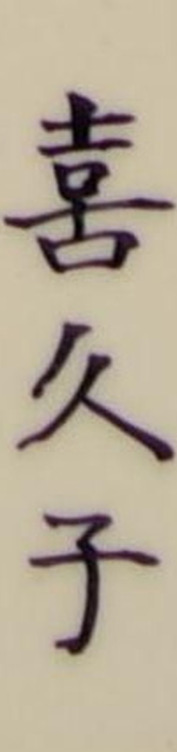喜久子
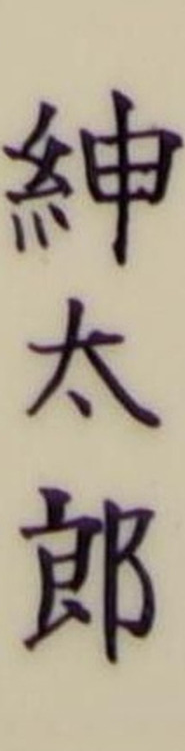紳太郎
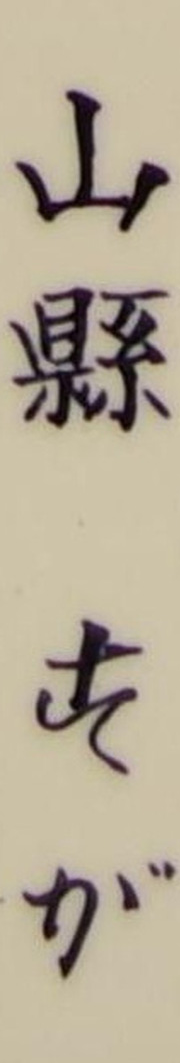山縣すが
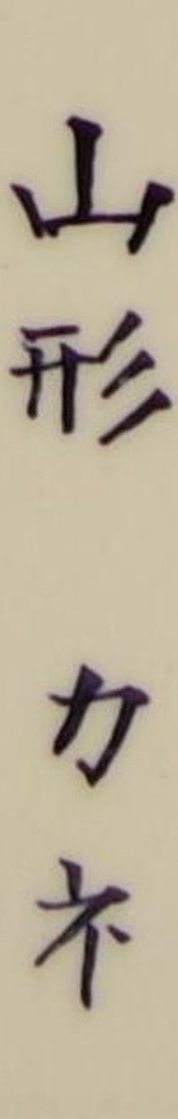山形カネ
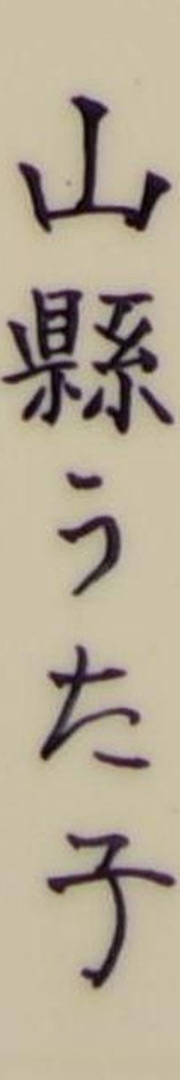山縣うた子
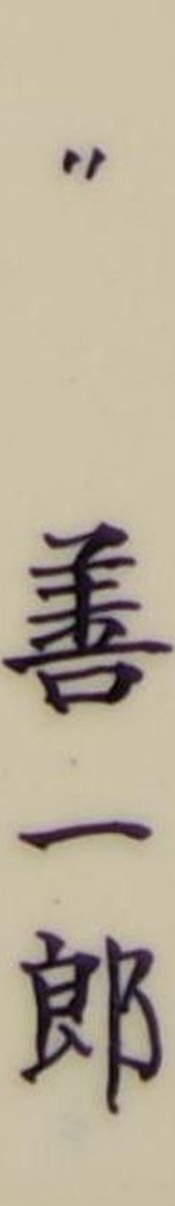善一郎
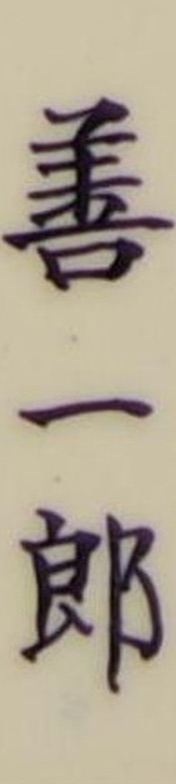善一郎
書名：A~D
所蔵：koyasan kongobuji
